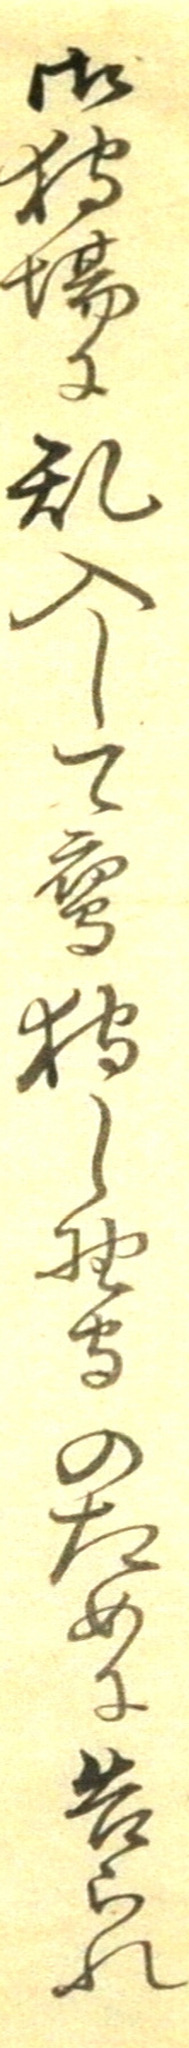御狩場に乱入して鷹狩し野守のために告られ
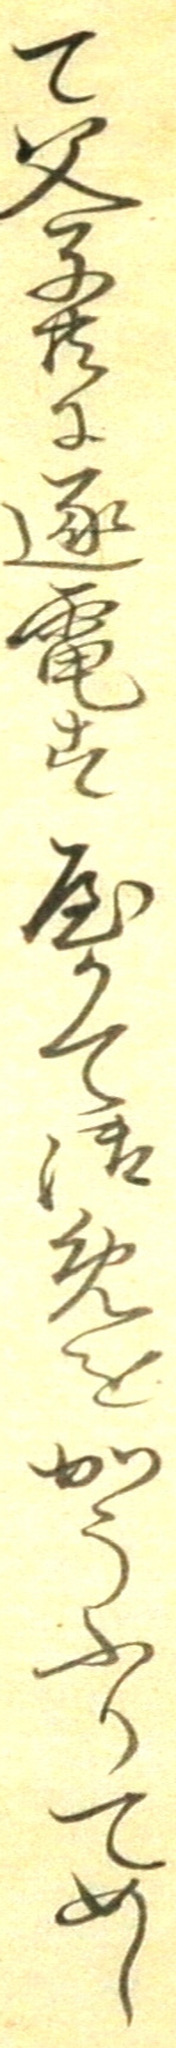て父子共に逐電すやかて御免をかうふりてめし
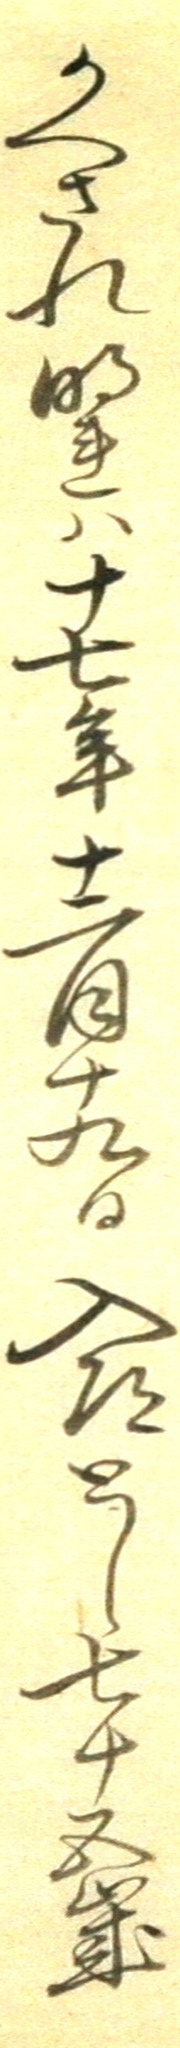かへされ明れは十七年十二月十九日入道とし七十五歳
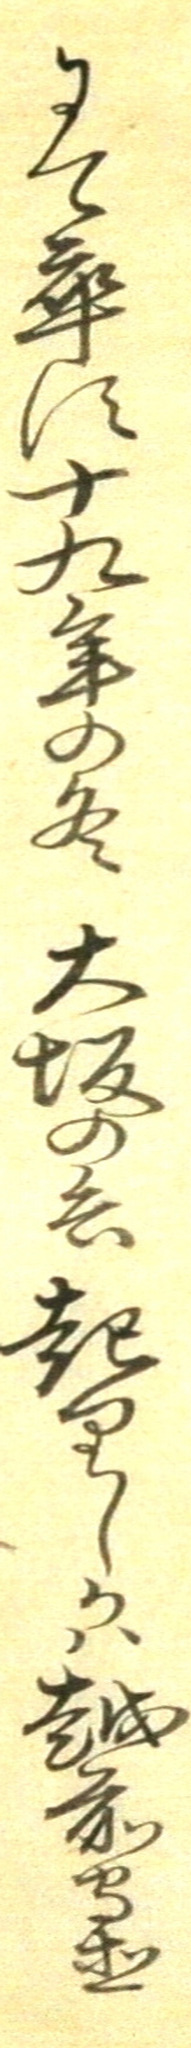にて卒す十九年の冬大坂の兵起りしかは越前守直
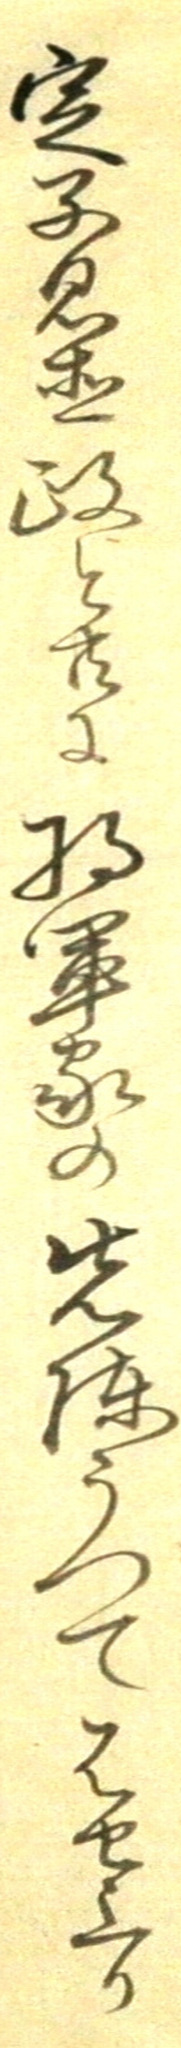定子息直政と共に将軍家の先陣うつてはせ上り
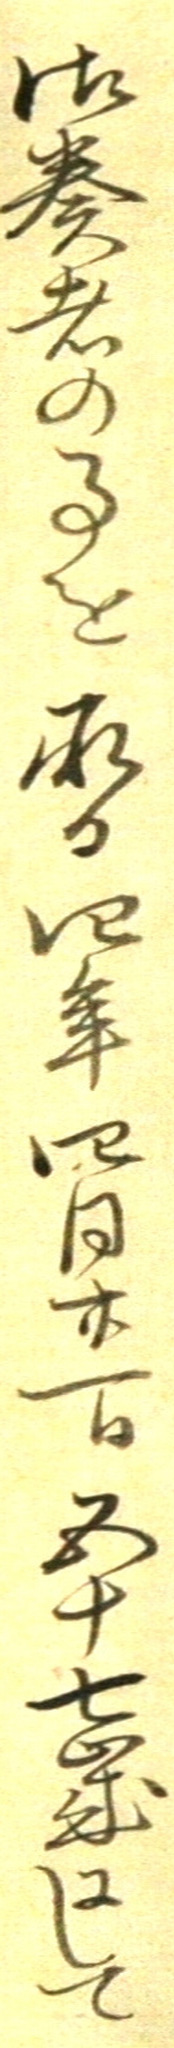御奏者の事を承る四年四月廿一日五十七歳にして

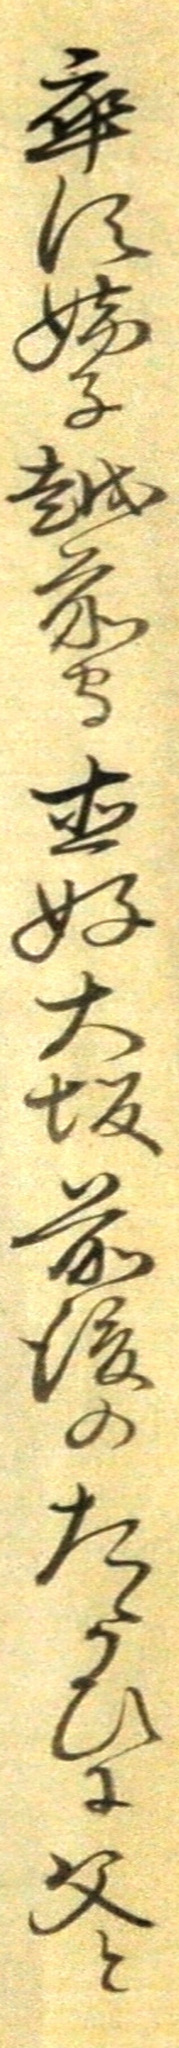卒す嫡子越前守直好大坂前後のたゝかひに父と
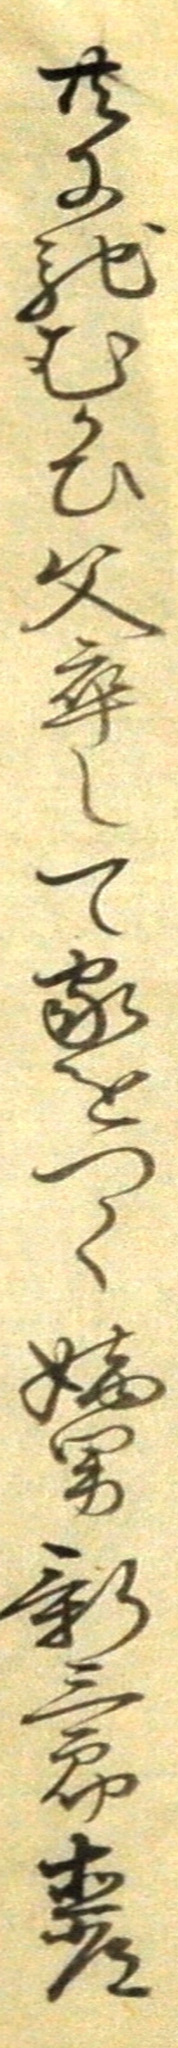共に馳むかひ父卒して家をつく嫡男新三郎直常
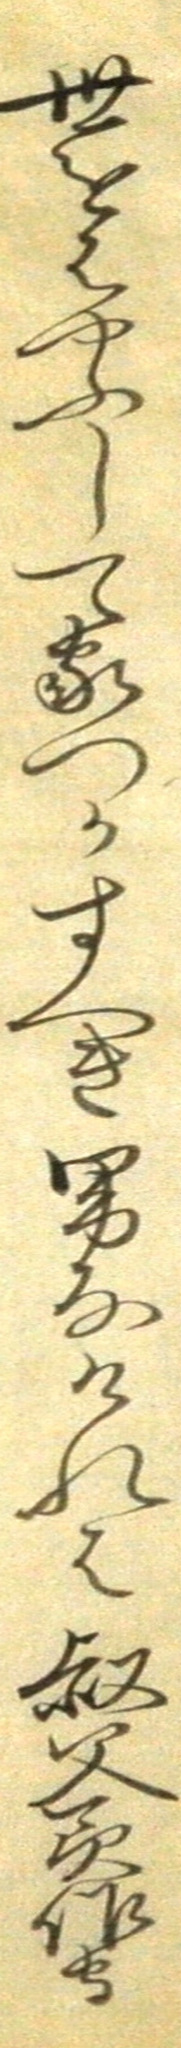世をはやふして家つかすへき男なけれは叔父美作守
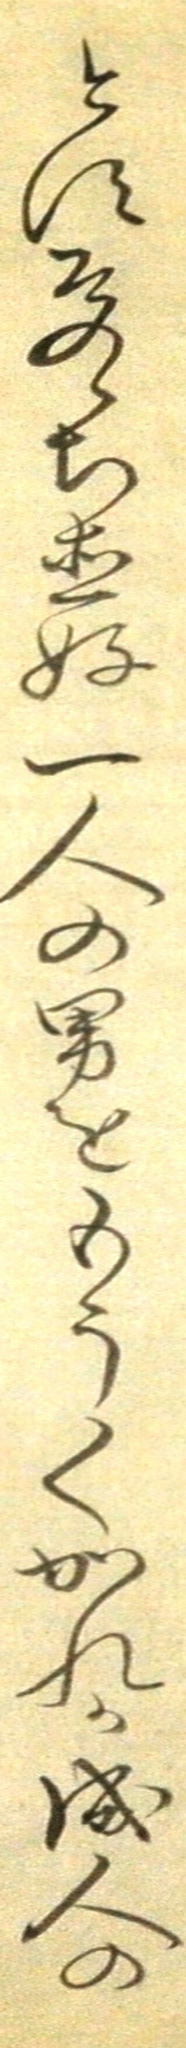とすそのゝち直好一人の男をもうくかれか成人の
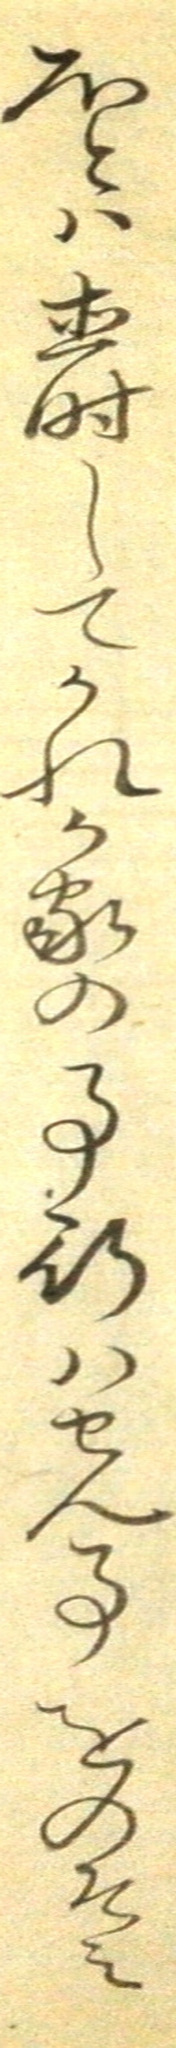ほとは直時してかれか家の事行はせん事をのそみ
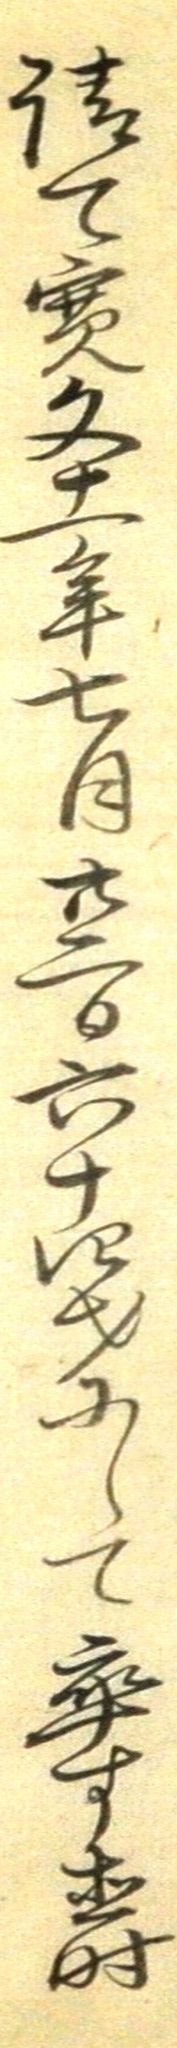請て寛文十一年七月廿二日六十四才にして卒す直時
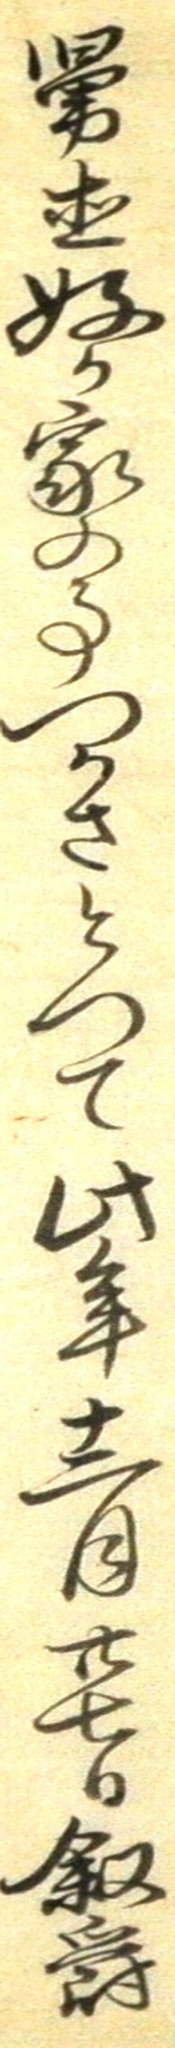舅直好か家の事つかさとつて此年十二月廿七日叙爵
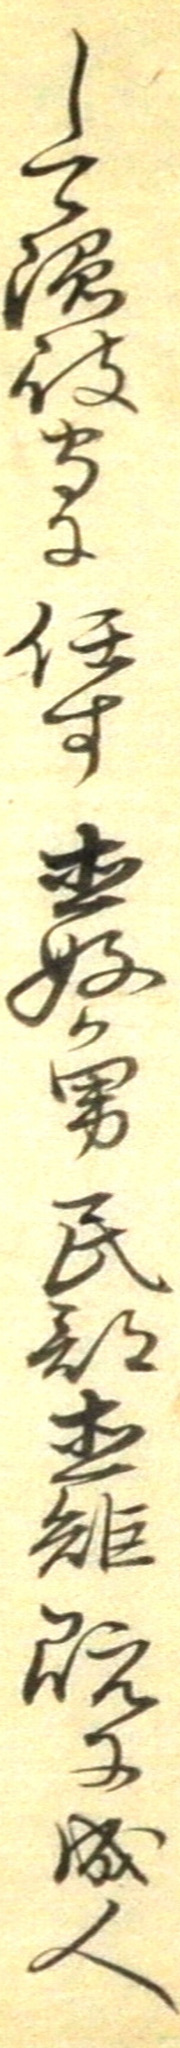して隠岐守に任す直好か男民部直矩既に成人
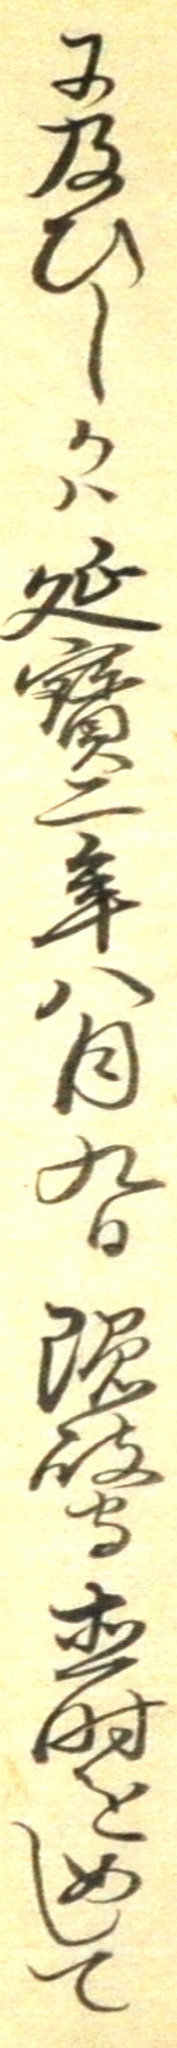に及ひしかは延宝二年八月九日隠岐守直時をめして
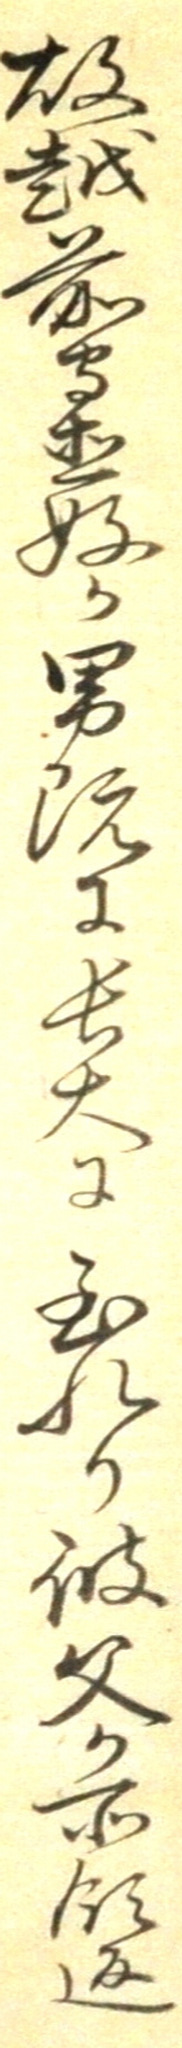故越前守直好か男既に長大に至れり彼父か所領返
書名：藩翰譜（八・下）
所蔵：伊那市立高遠町図書館・合同会社AMANE
